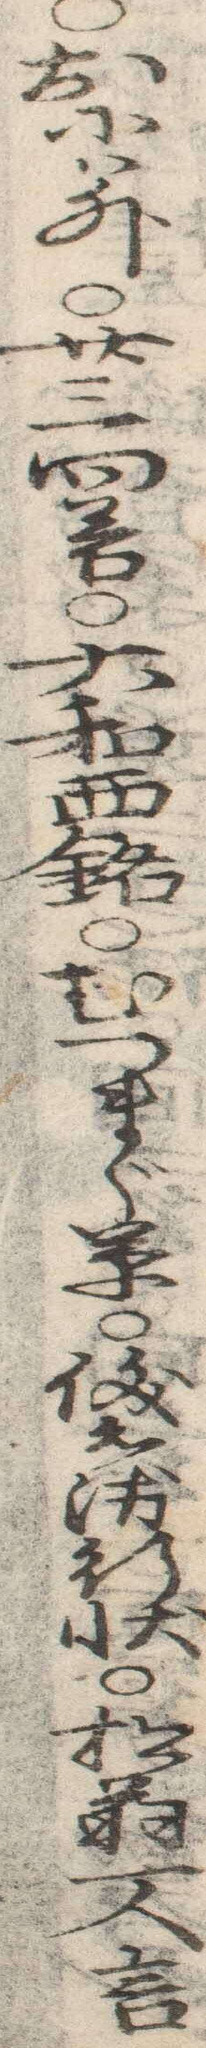○おには外○廿三問答○大和西銘○むつまじ草○儀兵衛行状○松翁一人言
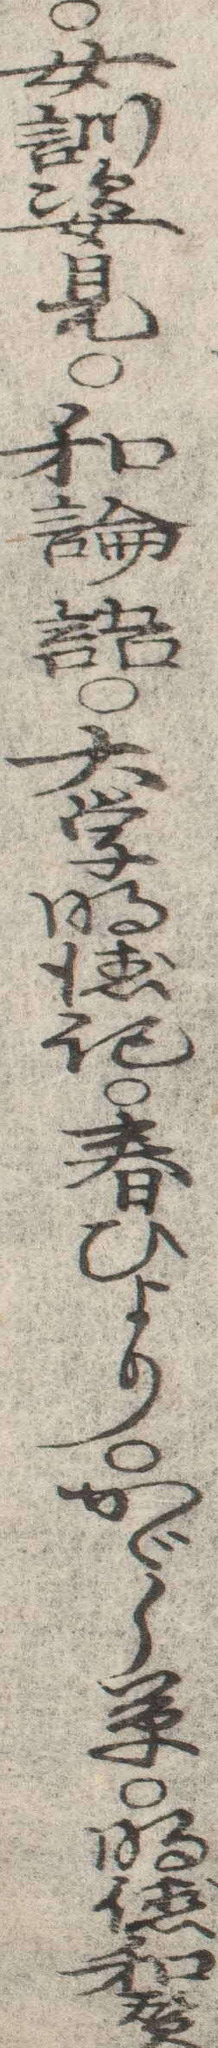○女訓姿見○和論語○大学明徳記○春ひより○かゞし草○明徳和賛
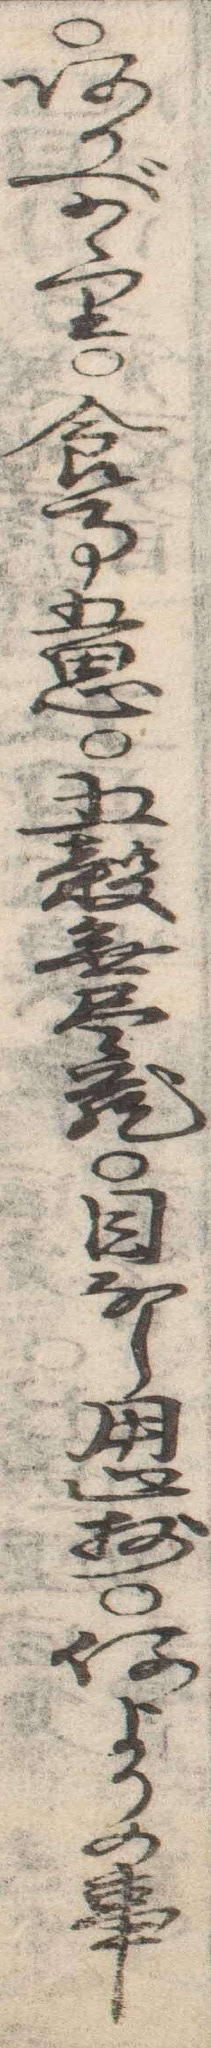○ありべかゝり○食事五思○五穀無尽蔵○目なし用心抄○何よりの事

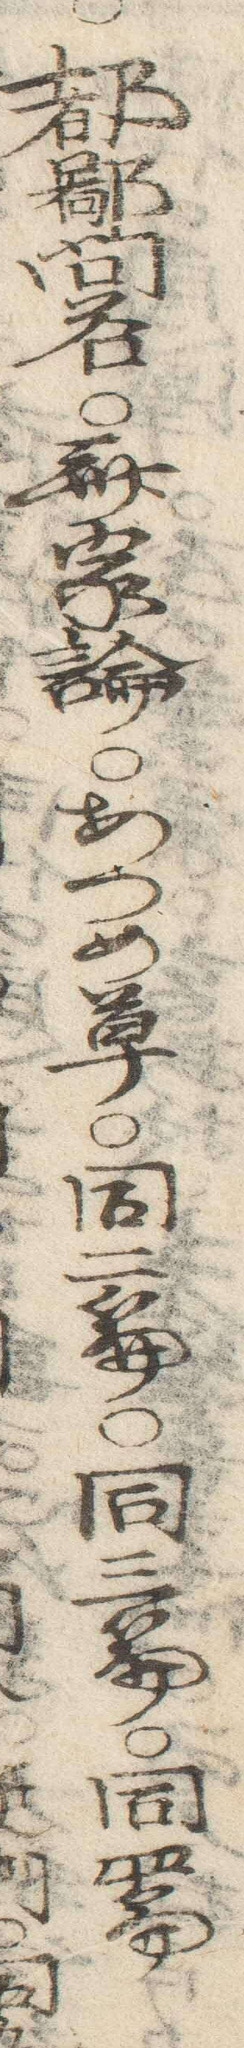○都鄙問答○斉家論○あつめ草○同二篇○同三篇○同四篇
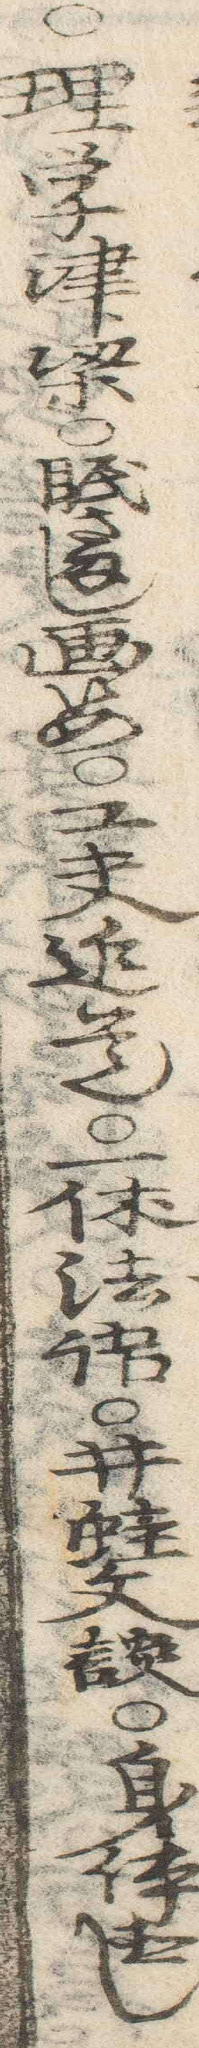○理学津梁○眠さまし画姿○工夫近道○一休法語○井蛙文談○身体直し
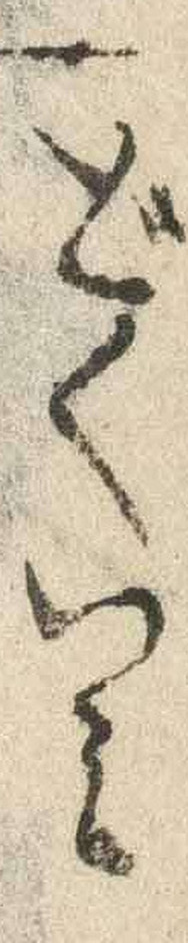どくいみ
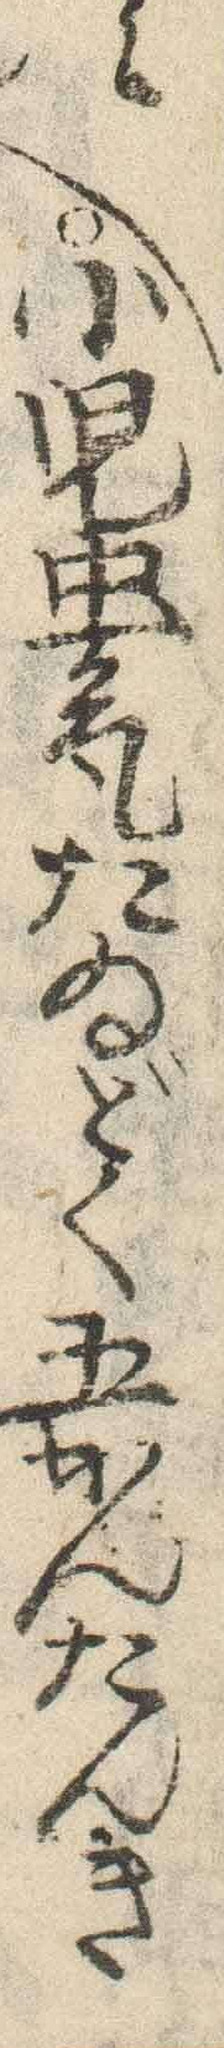○小児虫気たゐどく五かんたんき
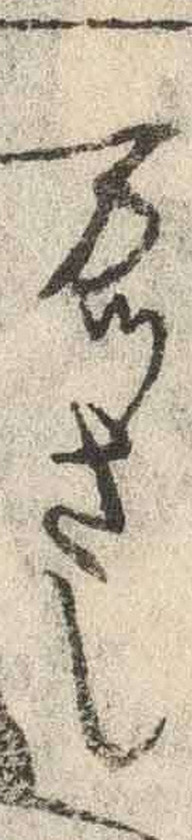まつさし
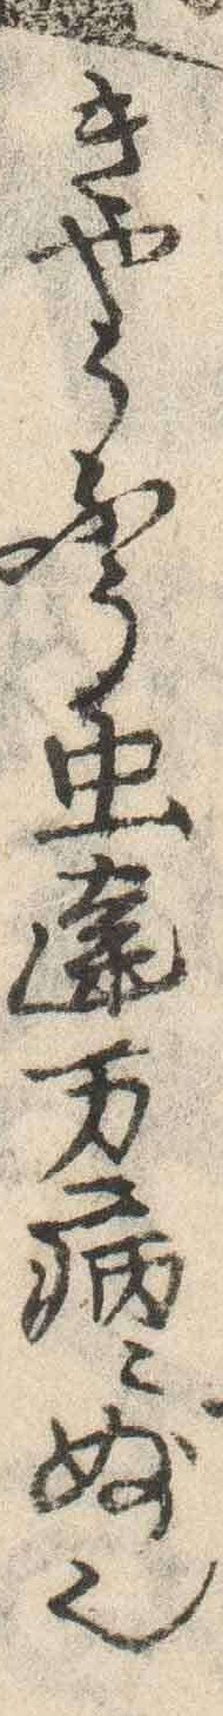きやうふう虫歯万病に妙也
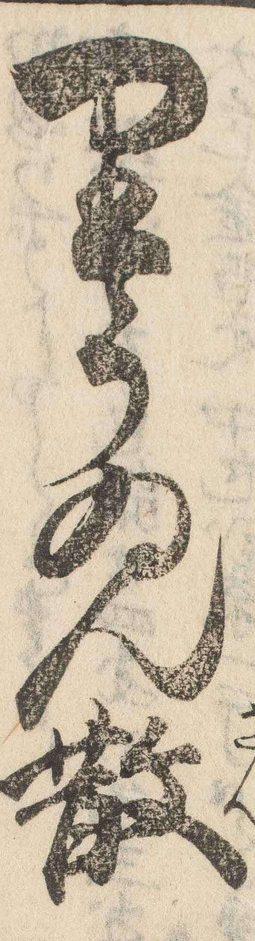りうゐん散
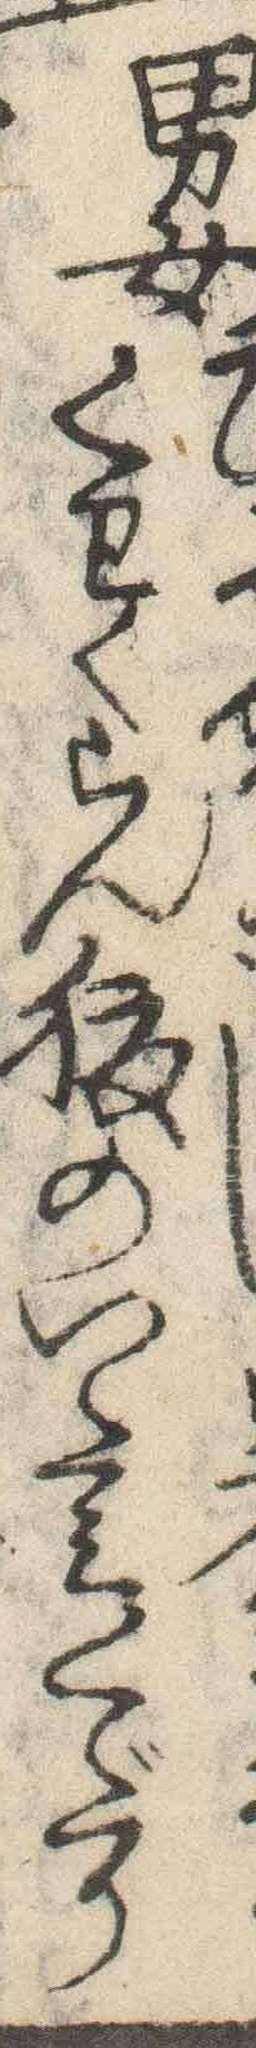男女くわくらん腹のいたみくだり
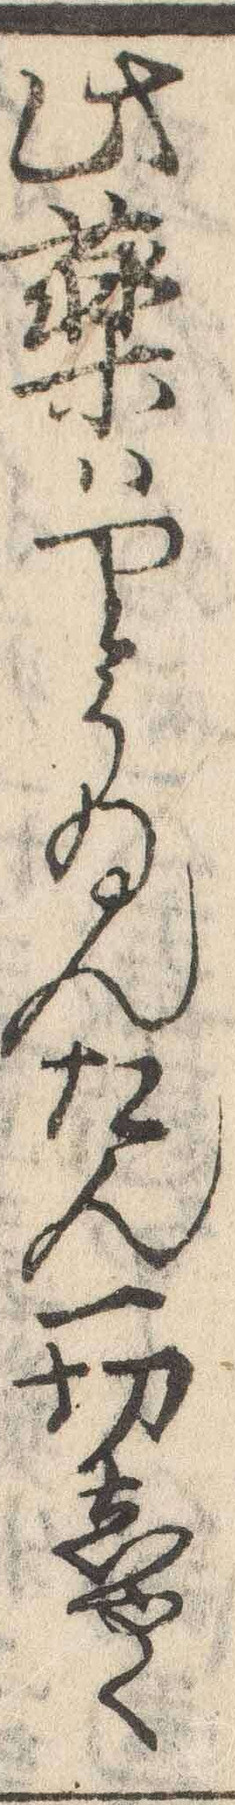此薬はりうゐんたん一切しやく
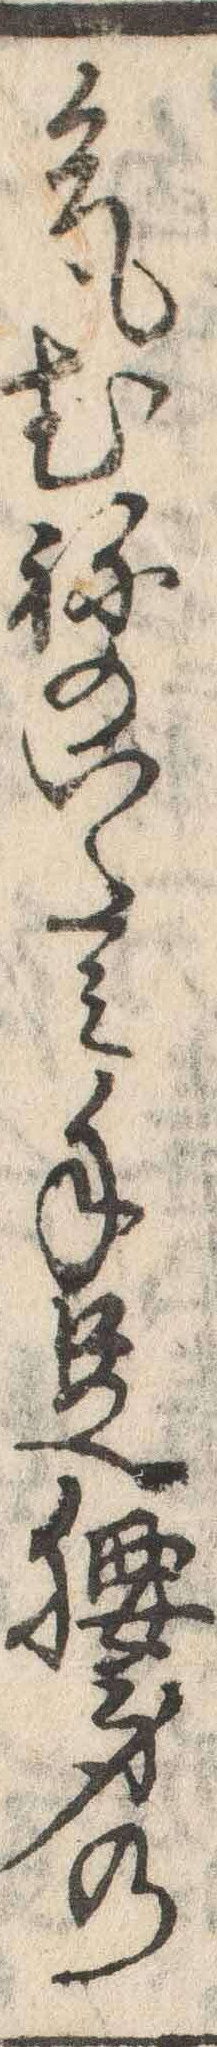気むねのいたみ手足腰身の
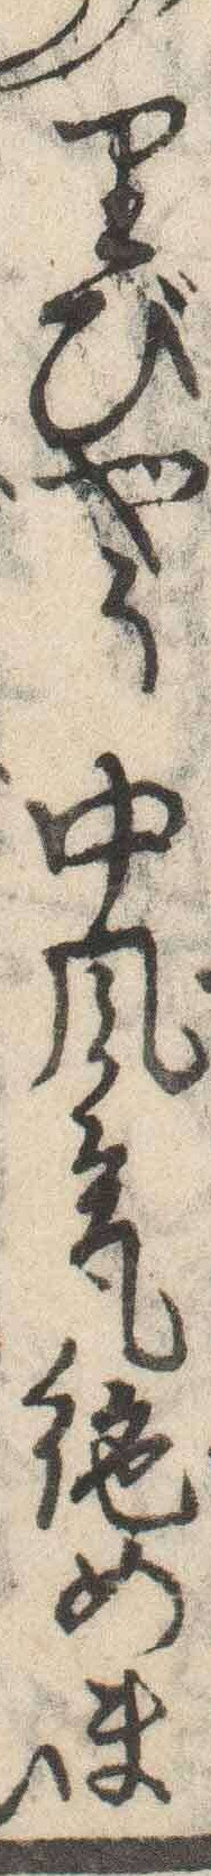りびやう中風気絶めまい
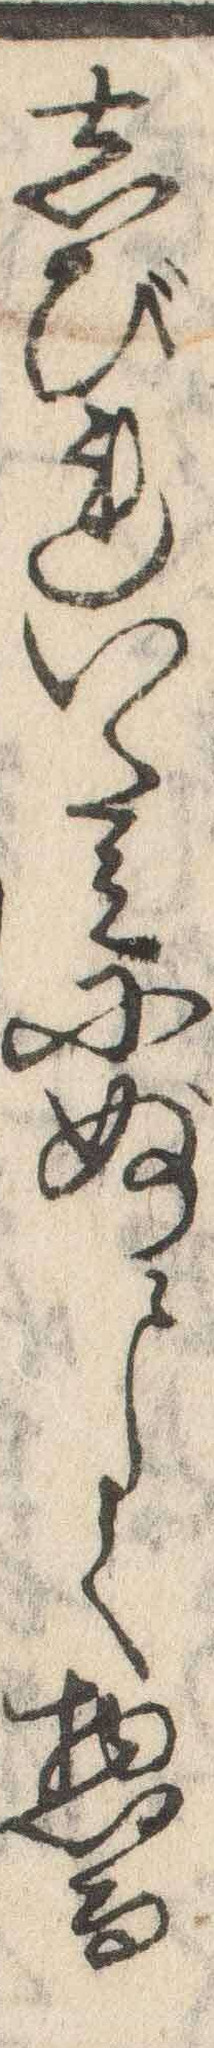しびれいたみに妙にして総て
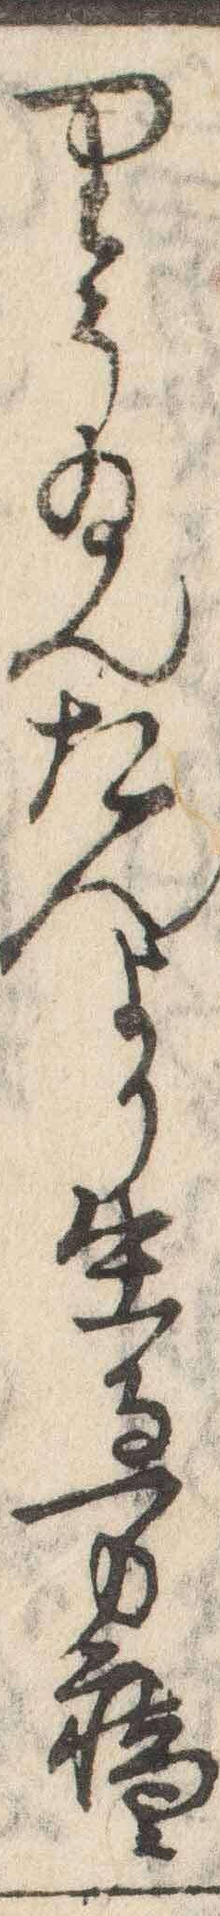りうゐんたんより生る万病に
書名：撫育草
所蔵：東京学芸大学附属図書館 国文学研究資料館
